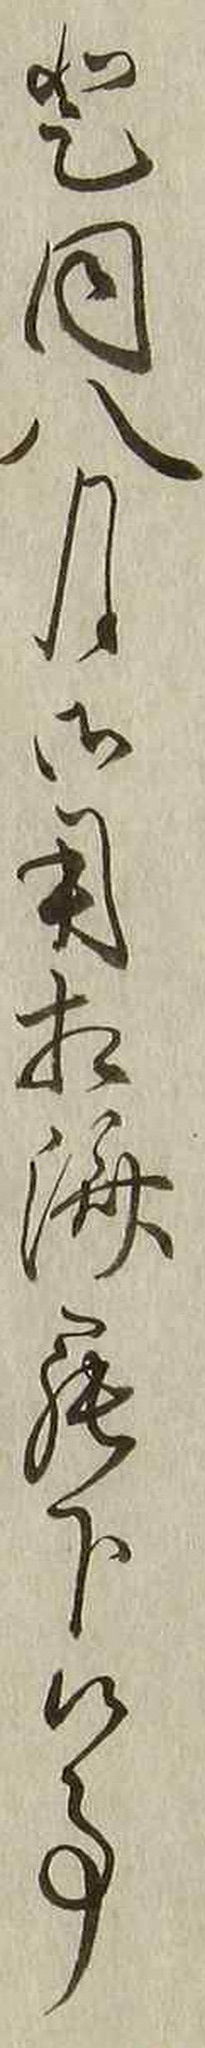登同八月御用相済罷下候事
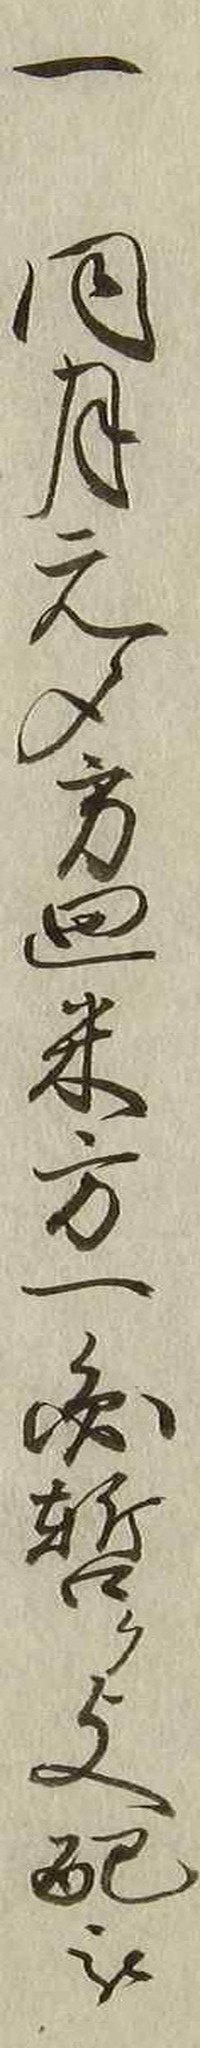一同月元〆方廻米方一円暫ク支配被
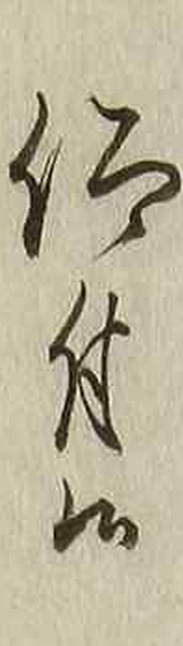仰付候
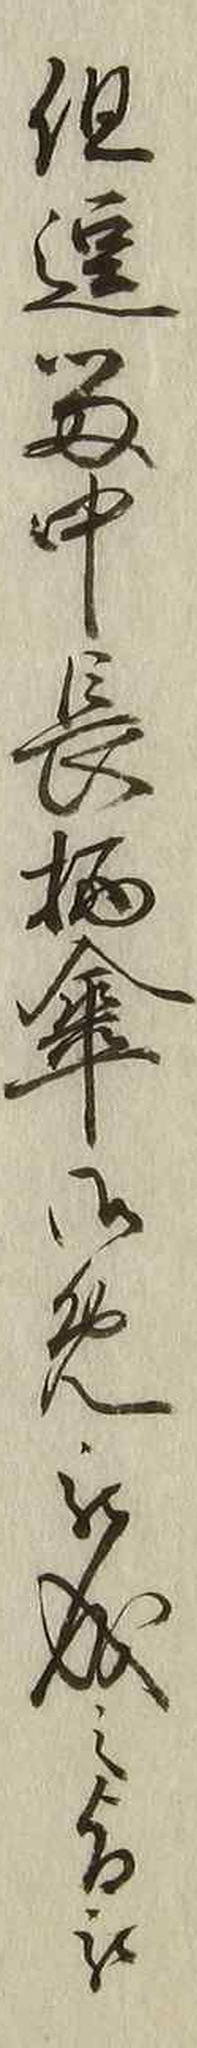但逗留中長柄傘御免被成之旨被
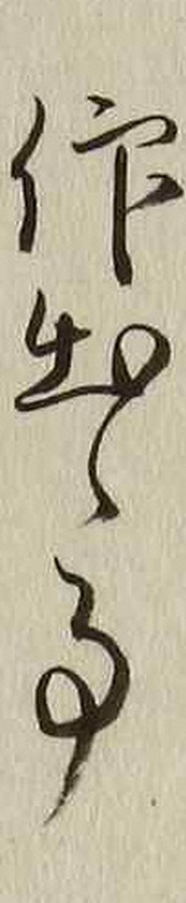仰出候事
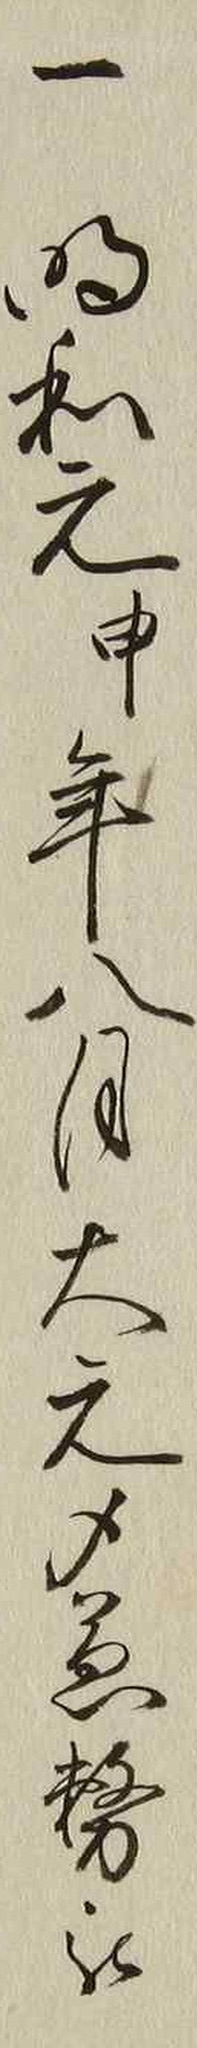一明和元申年八月大元〆兼務被
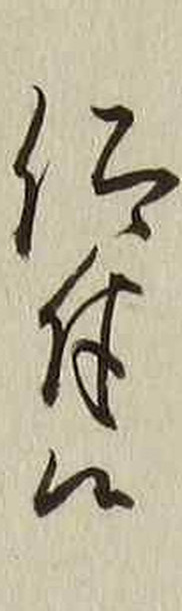仰付候
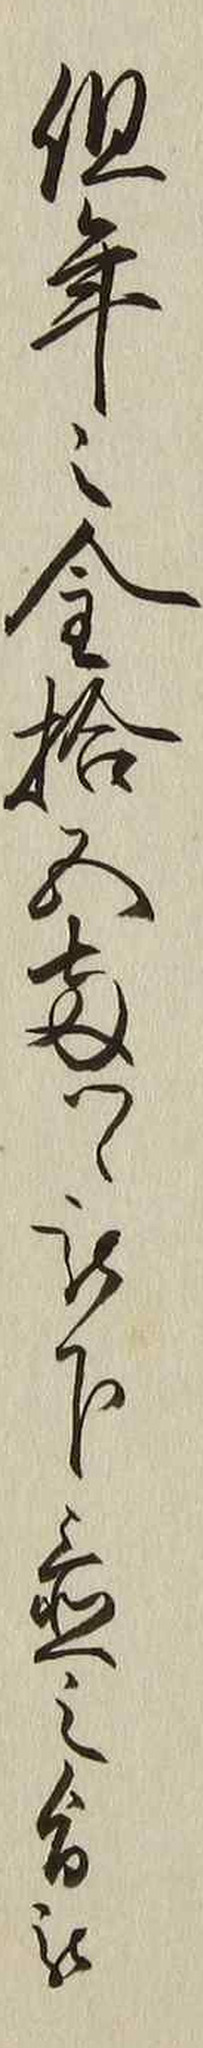但年々金拾五両つゝ被下置之旨被
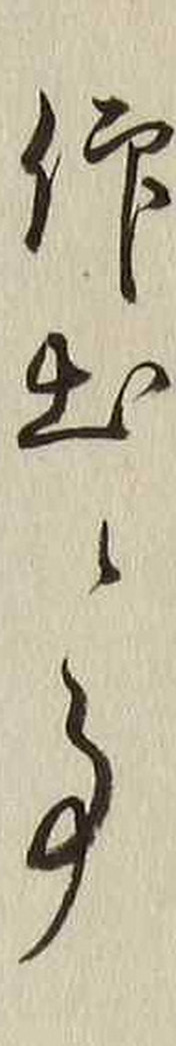仰出候事
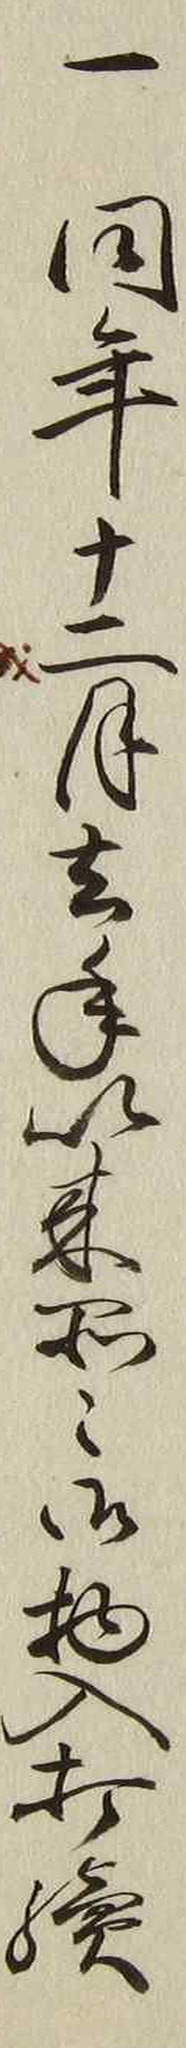一同年十二月去年以来品々御物入打続
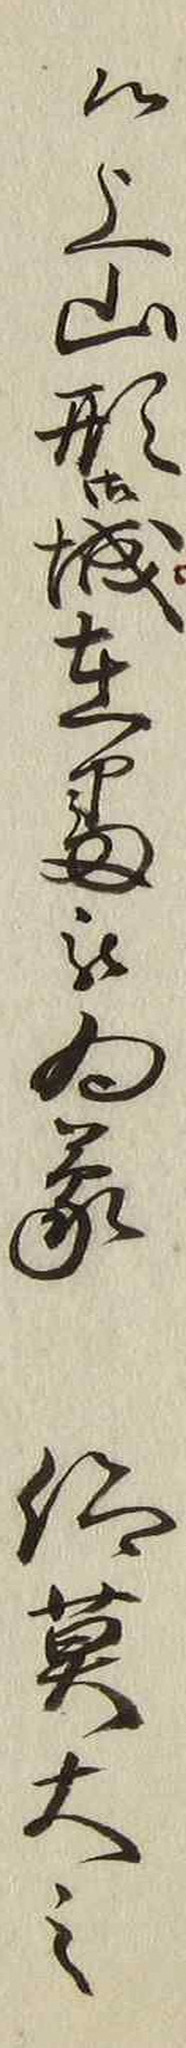侯上山形御城在番被為蒙仰莫大之
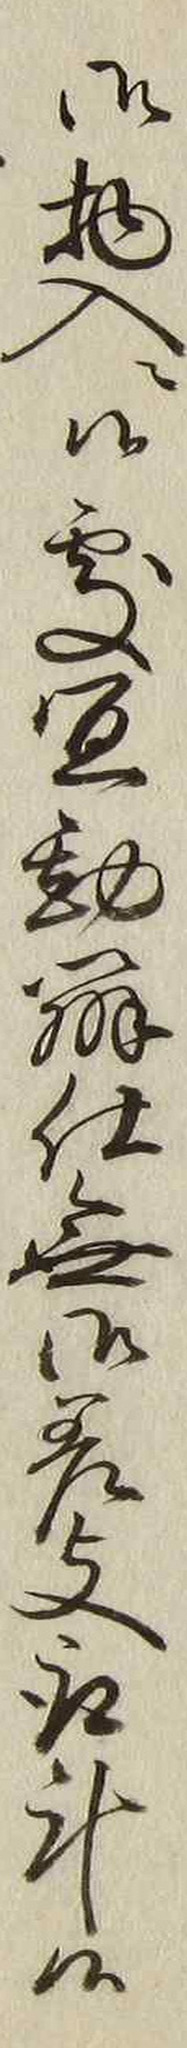御物入ニ候処宜勘弁仕無御差支取計候
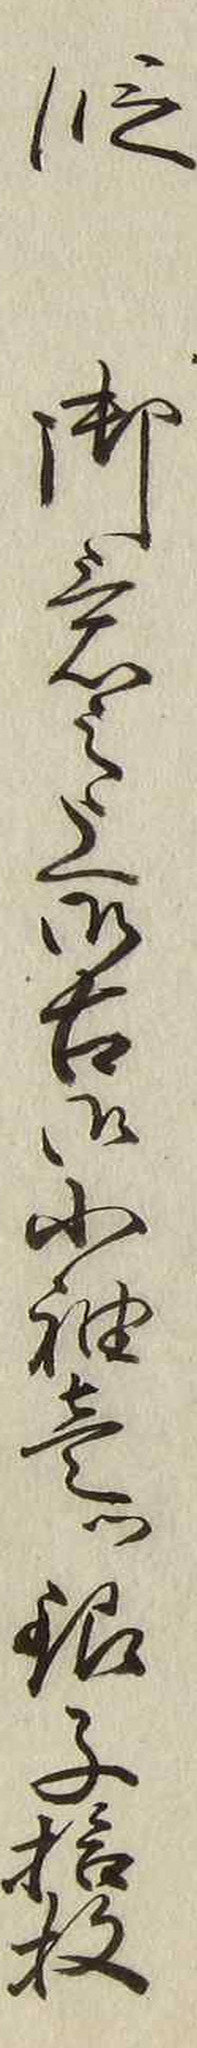段御意之上御古御小袖壱ツ銀子拾枚
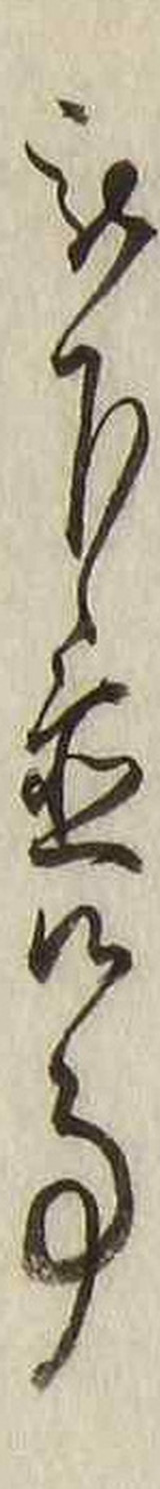被下置候事
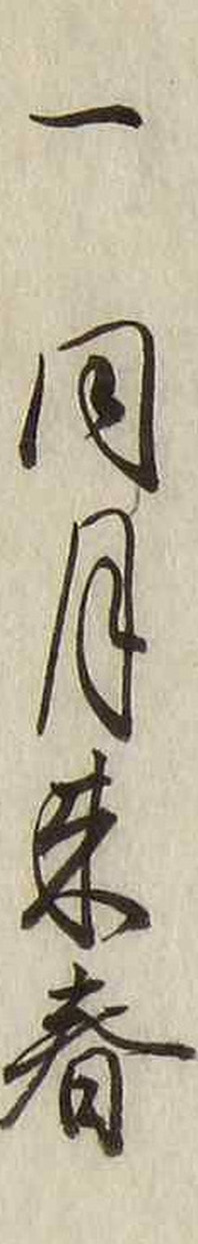一同月来春
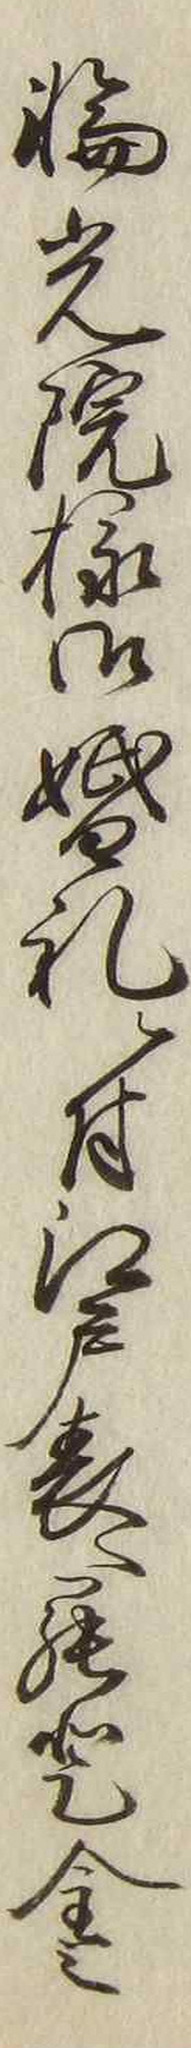輪光院様御婚礼ニ付江戸表へ罷登金之
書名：諸士系譜　巻之21　い之部21
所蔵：会津若松市立会津図書館
